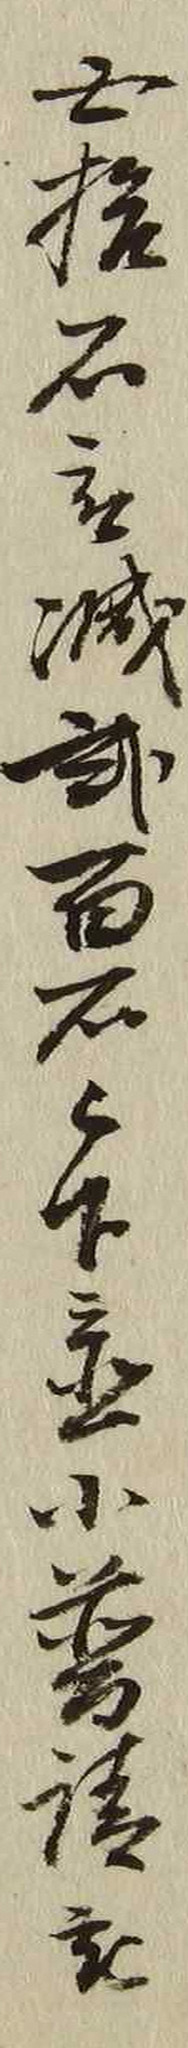五拾石被減二百石被下置小普請被
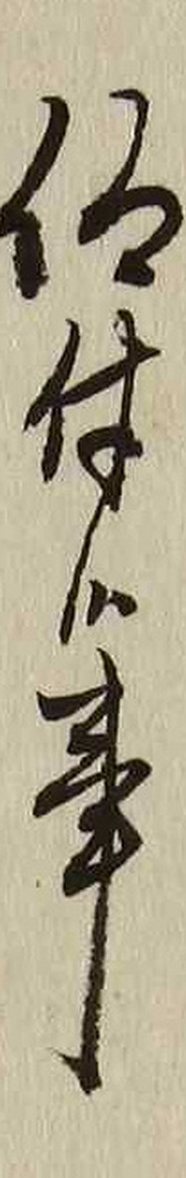仰付候事
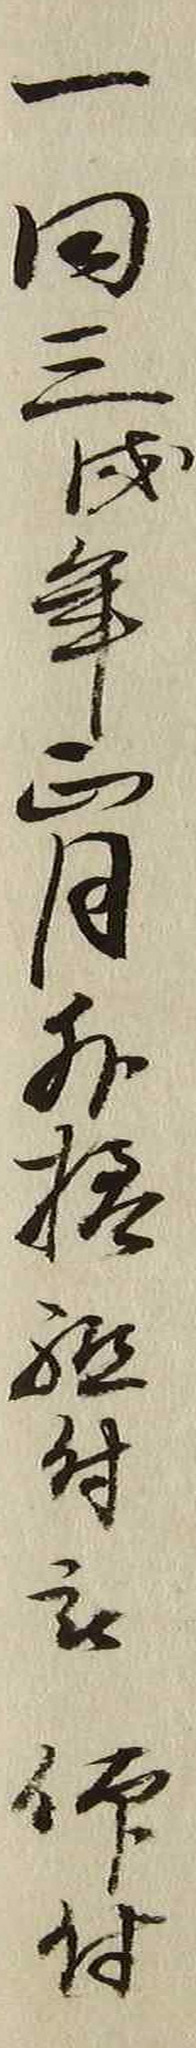一同三戌年正月外様組付被仰付
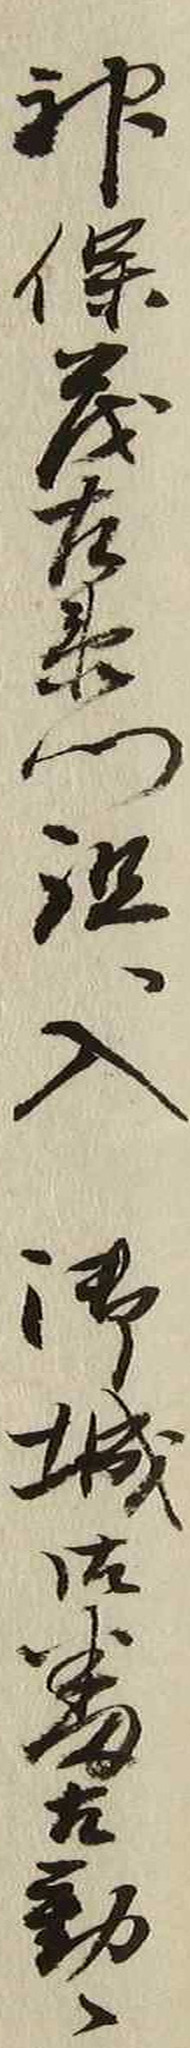神保茂左衛門組へ入御城御番相勤候
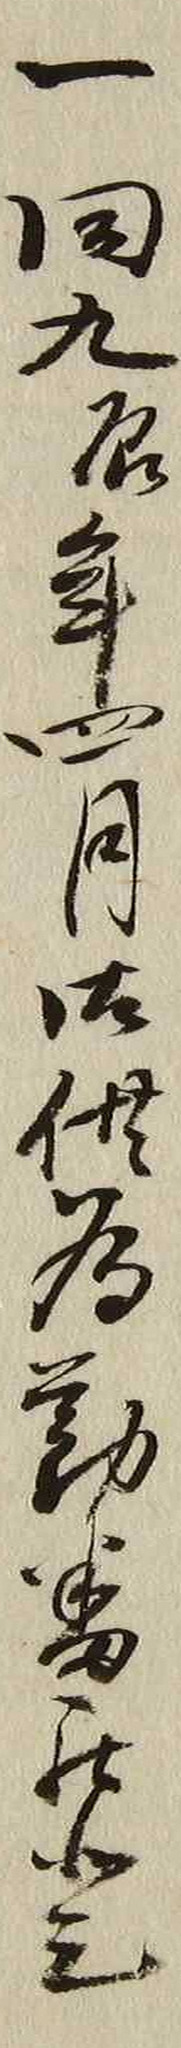一同九辰年四月御供為勤番罷登
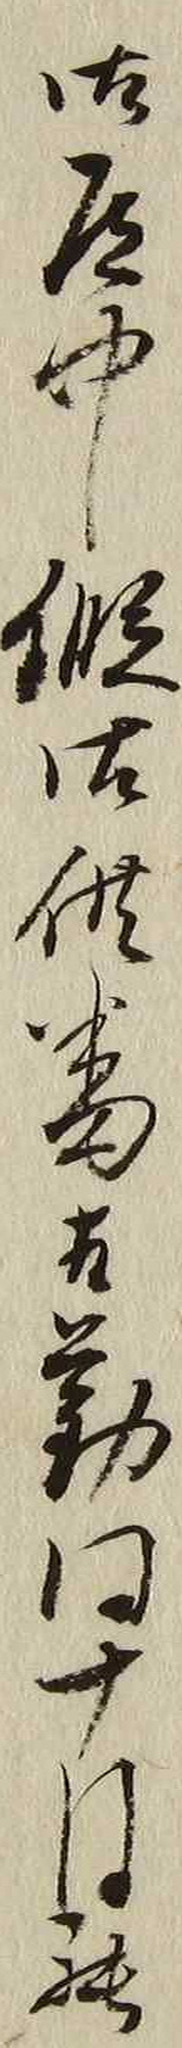御道中仮御供番相勤同十月罷
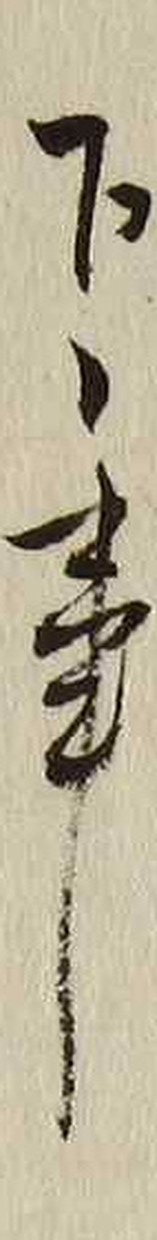下候事
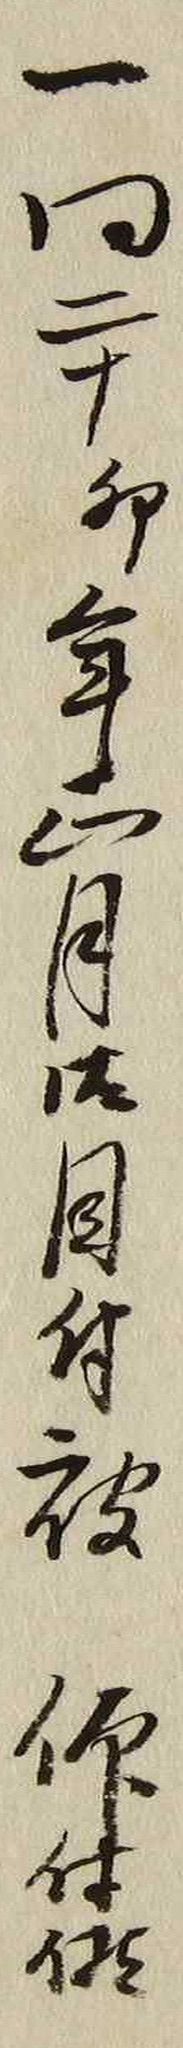一同二十卯年正月御目付被仰付候
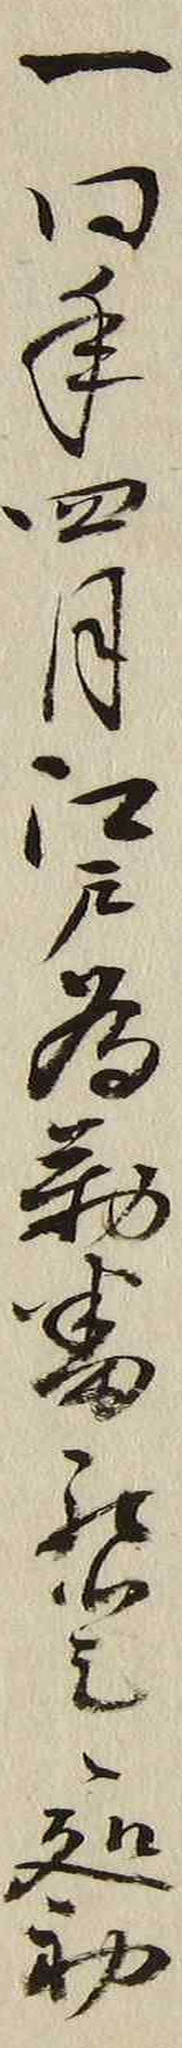一同年四月江戸為勤番罷登候処初
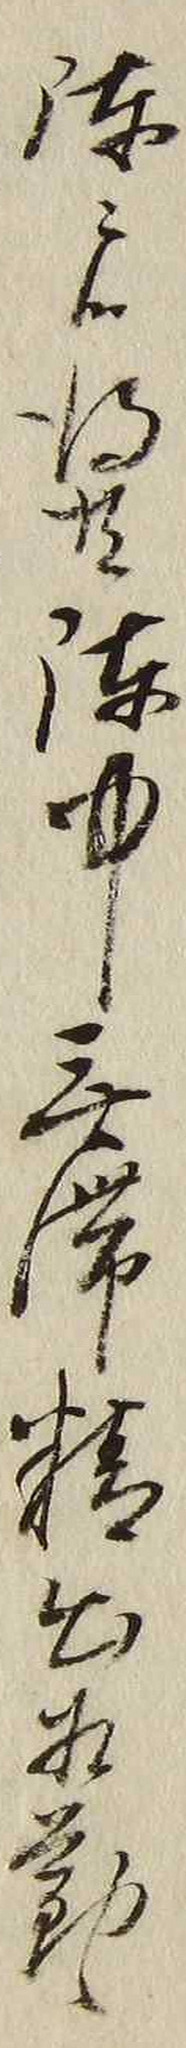陣ニ候得共陣中無滞精出相勤候
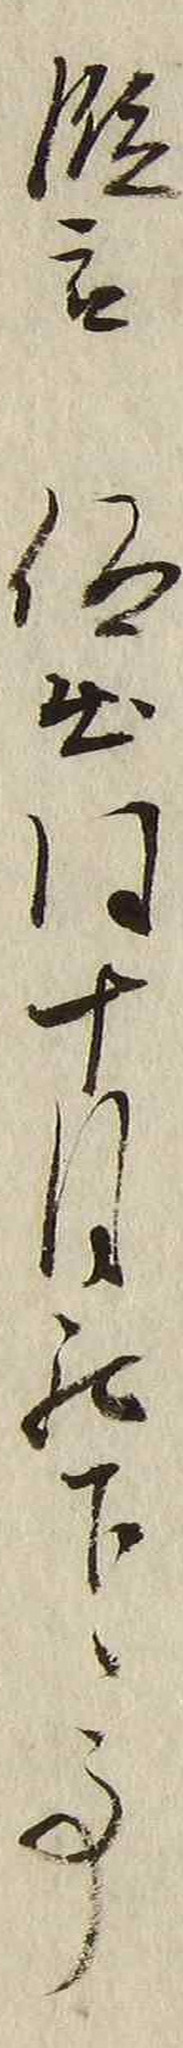段被仰出同十月罷下候事

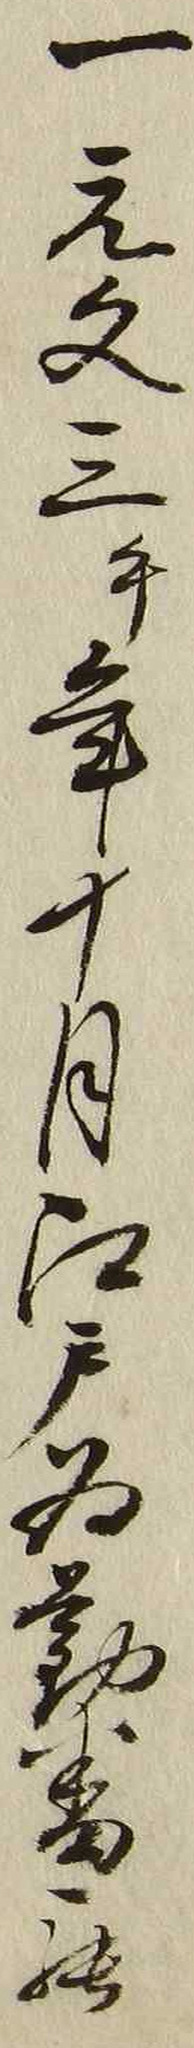一元文三午年十月江戸為勤番罷
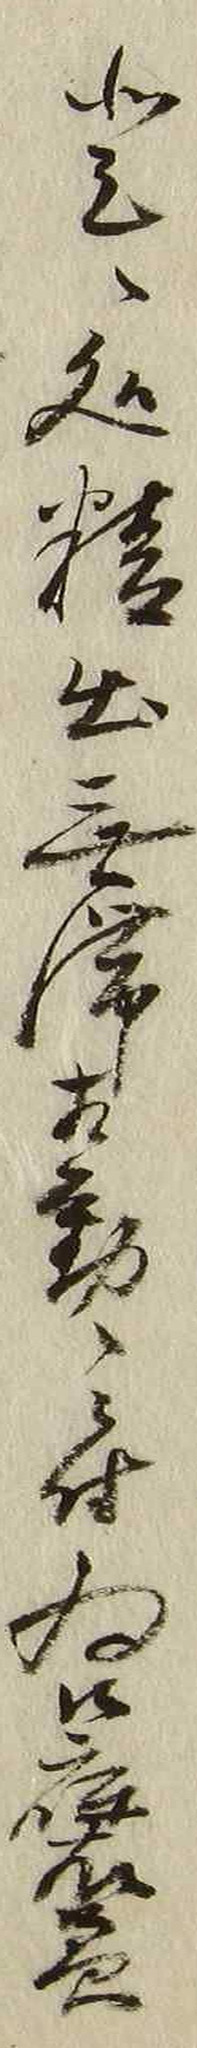登候処精出無滞相勤候ニ付為御褒美
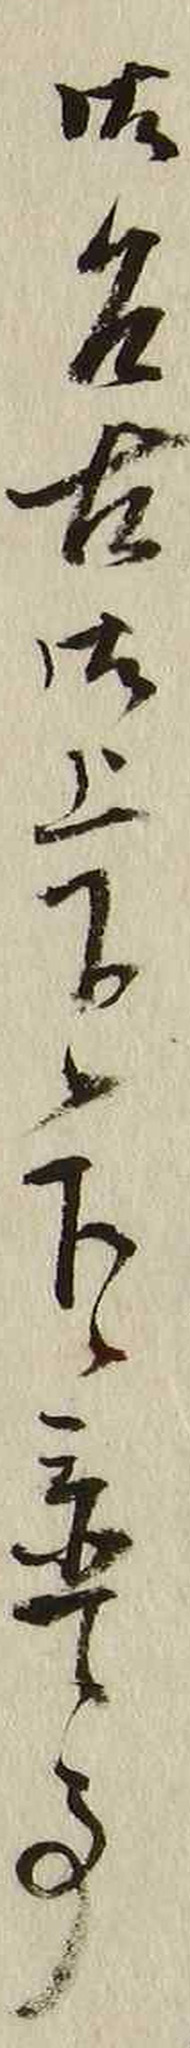御召古御上下被下置候事
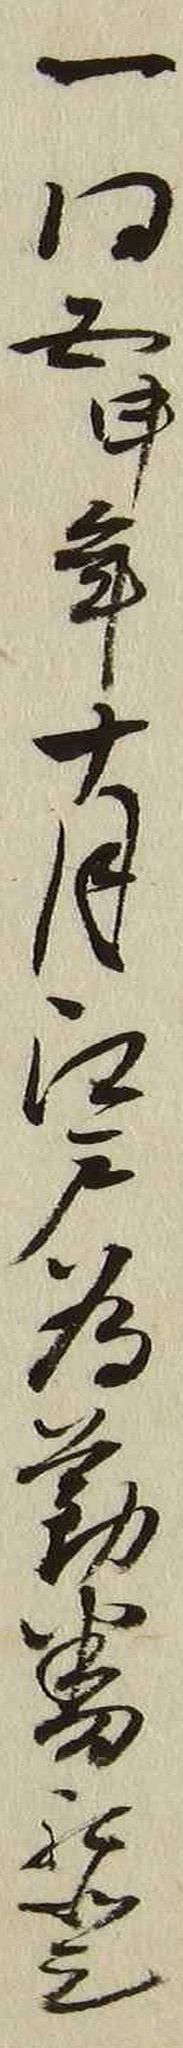一同五申年十月江戸為勤番罷登
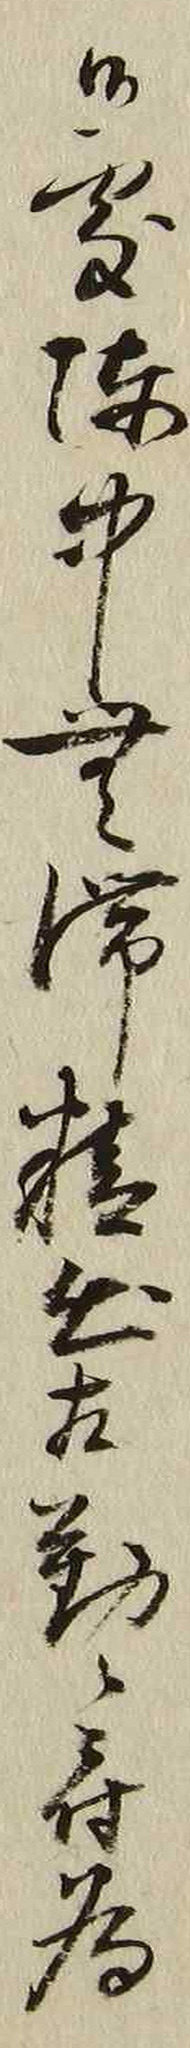候処陣中無滞精出相勤候ニ付為
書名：諸士系譜　巻之352　す之部2
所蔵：会津若松市立会津図書館
